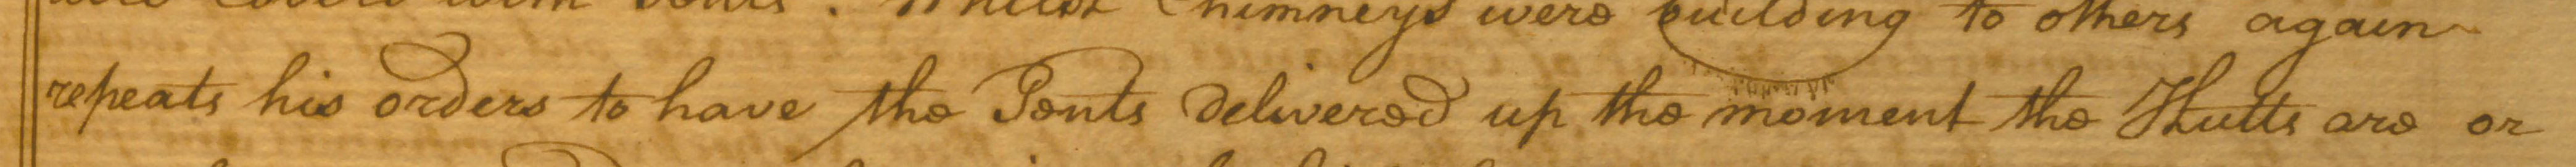repeats his orders to have the Tents delivered up the moment the Hutts are or
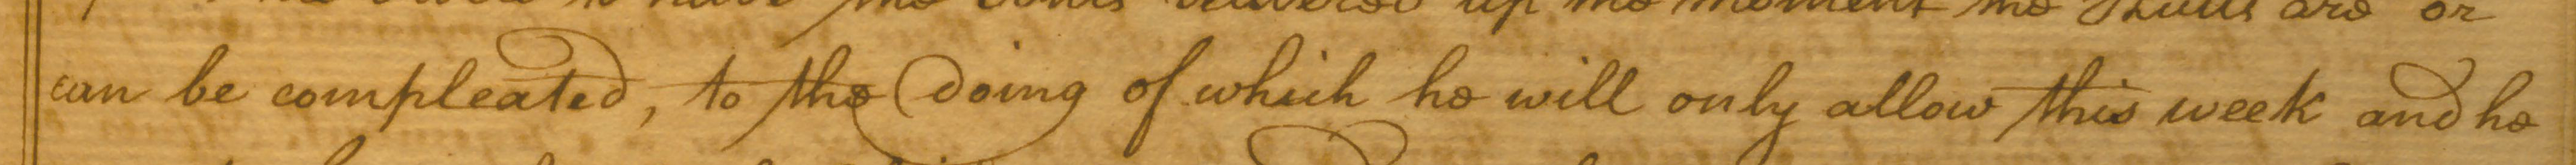can be compleated, to the doing of which he will only allow this week and he
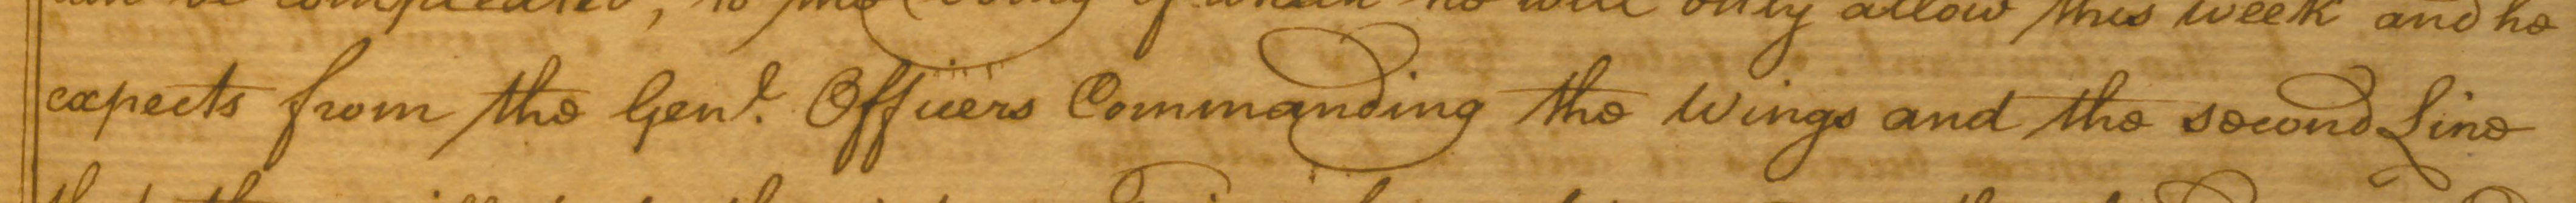expects from the Gen^l. Officers Commanding the Wings and the second Line
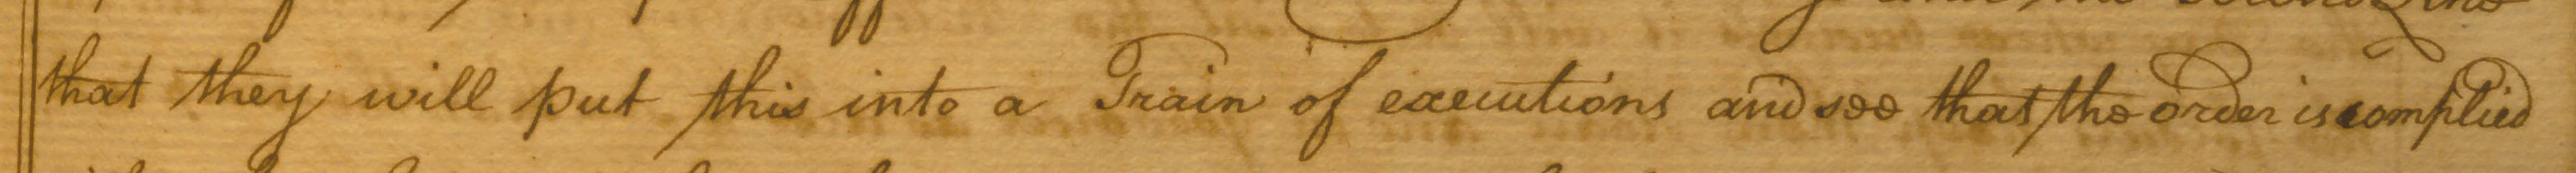that they will put this into a Train of executions and see that the order is complied
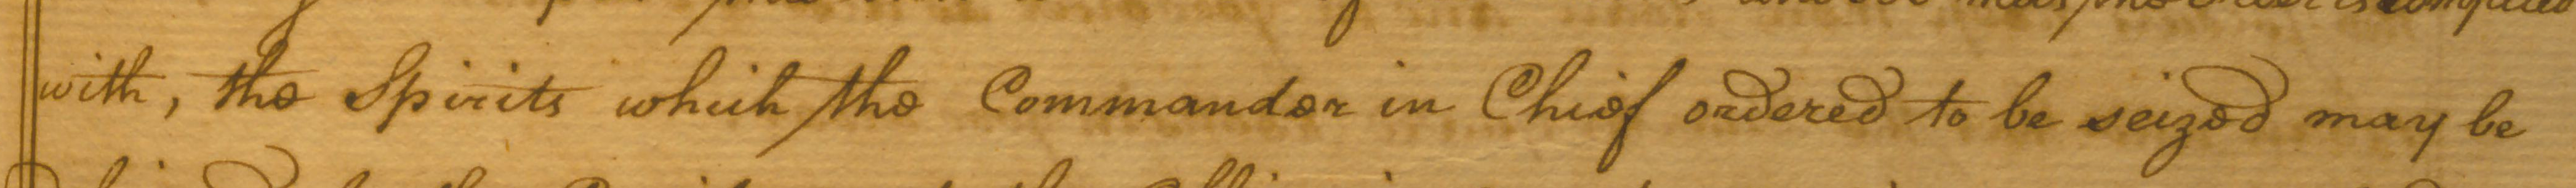with, the Spirits which the Commander in Chief ordered to be seized may be
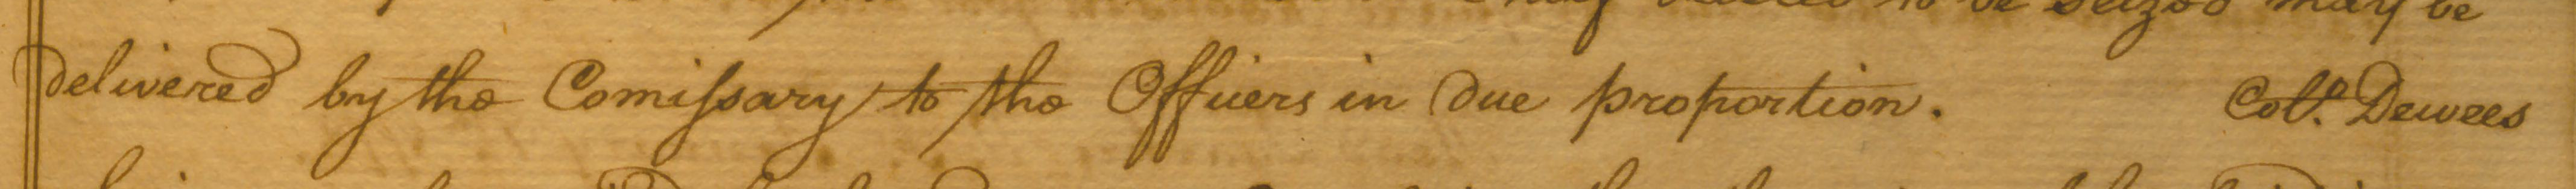delivered by the Comissary to the Officers in due proportion. Col^o. Dewees
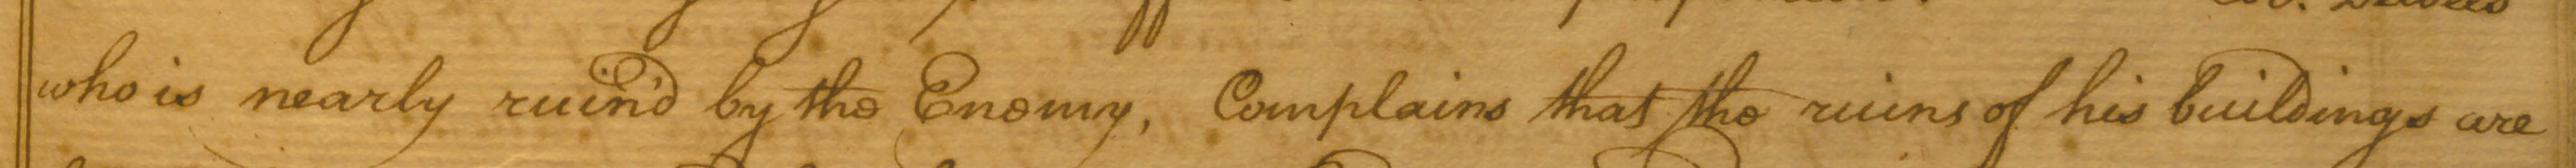who is nearly ruin'd by the Enemy, Complains that the ruins of his buildings are
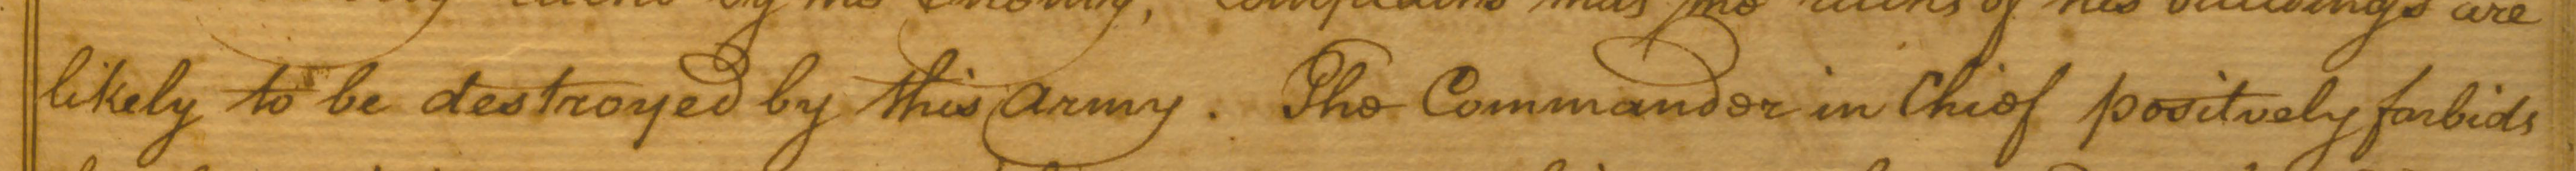likely to be destroyed by the army. The Commander in Chief positively forbids
